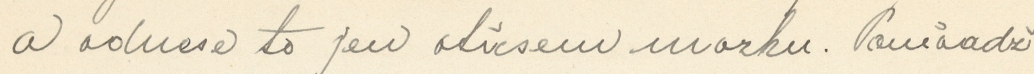a odnese to jen otřesem mozku. Poněvadž
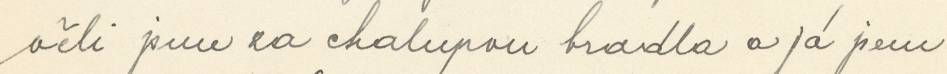věli jsme za chalupou bradla a já jsem
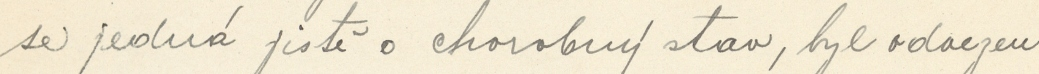se jedná jistě o chorobný stav, byl odvezen
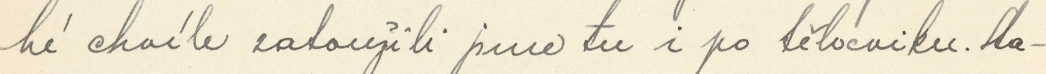hé chvíle zatoužili jsme tu i po tělocviku. Sta-
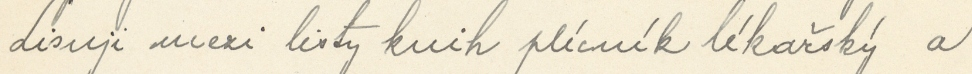Lisuji mezi listy knih plícník lékařský a
